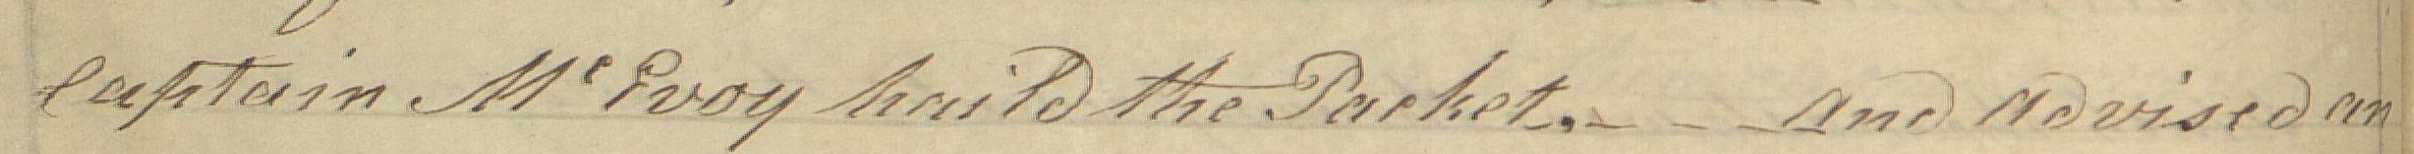Captain M^cEvoy haild the Packet. and advised an
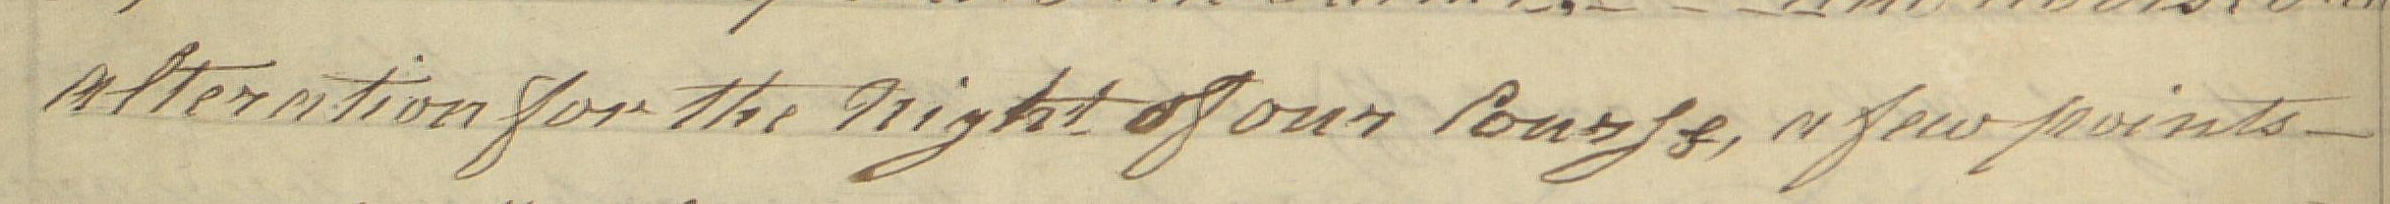alteration for the night of our Course, a few points
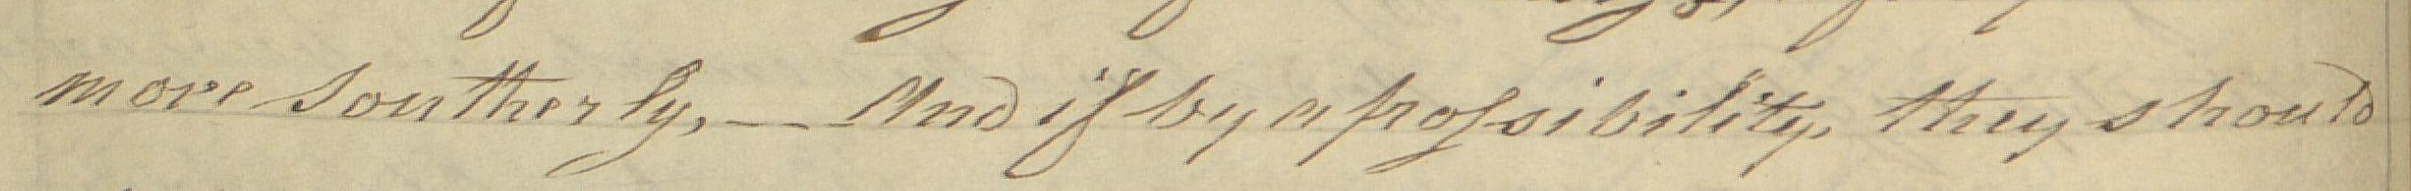more Southerly, And if by a possibility they should
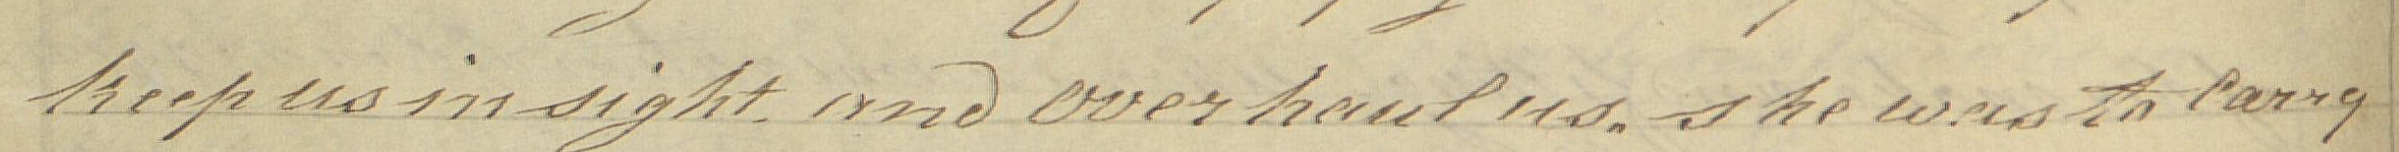keep us in sight and over haul us. she was to Carry
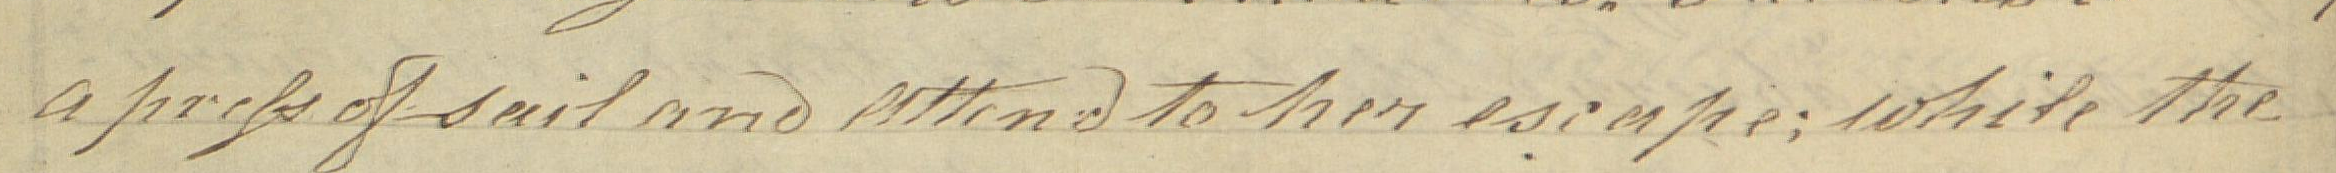a press of sail and attend to his escape while the
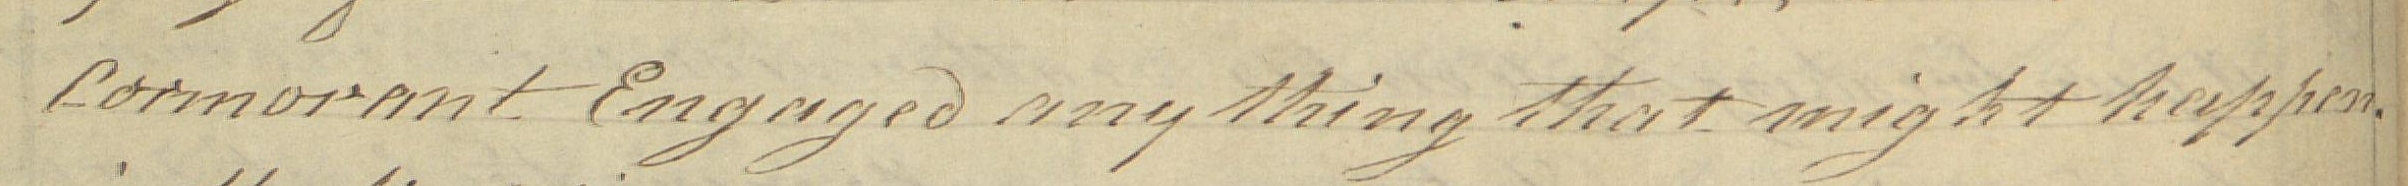Cormorant Engaged my thing that might happen.
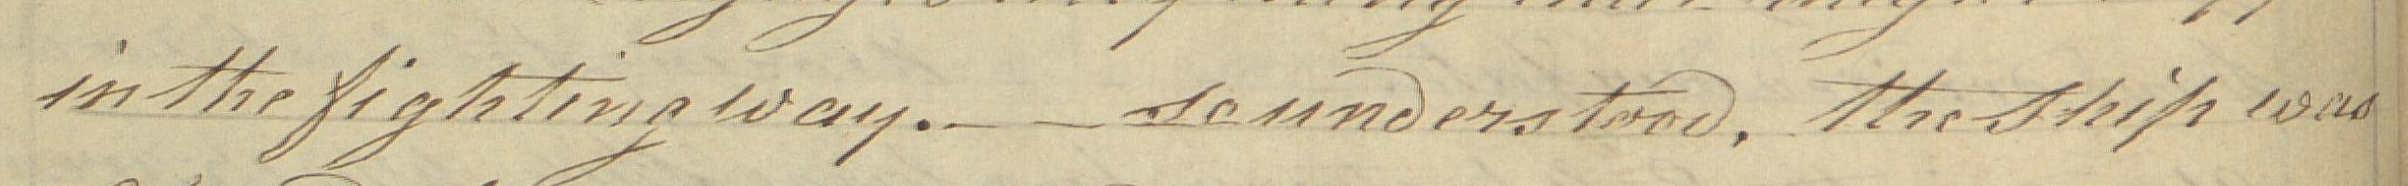in the fighting way. So understood, the Ship was
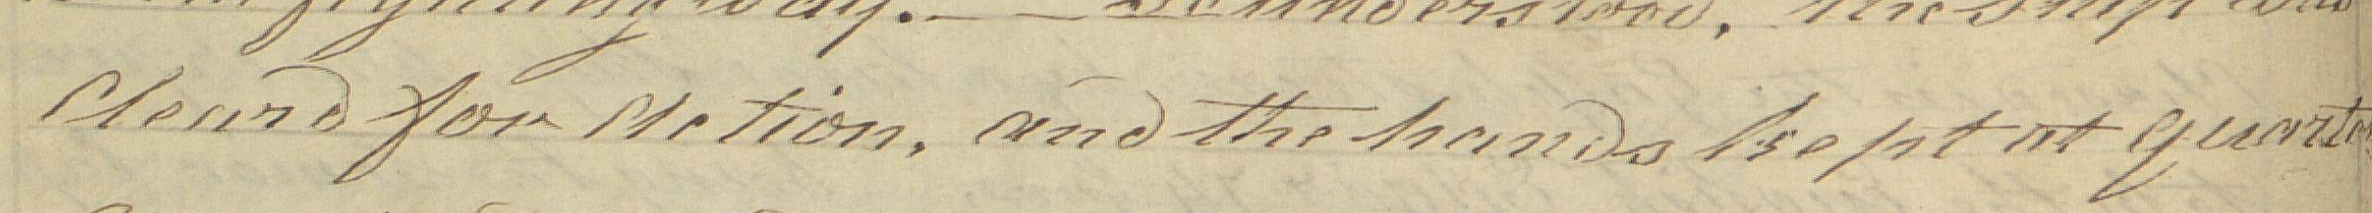Cleard for Action, and the hands kept at quarter
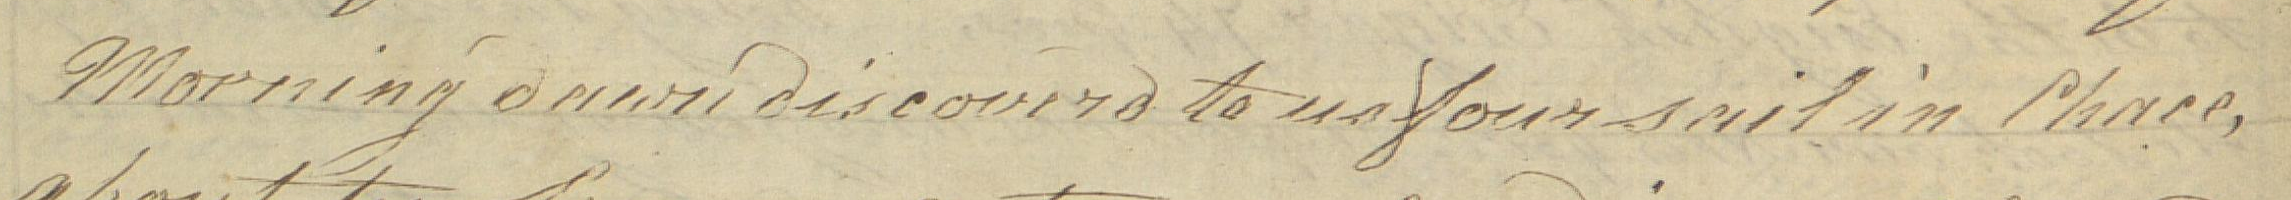Morning dawn discoverd to us four sail in Chace,
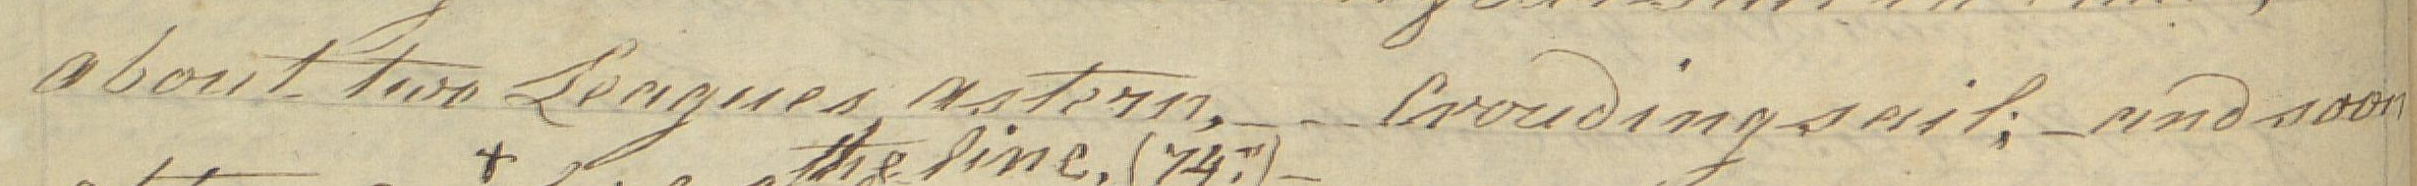about two Leagues astern, Crouding sail; and soon
